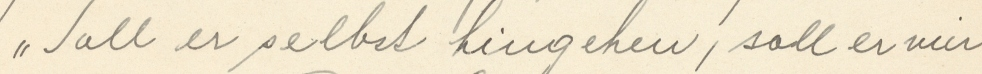„Soll er selbst hingehen, soll er mir
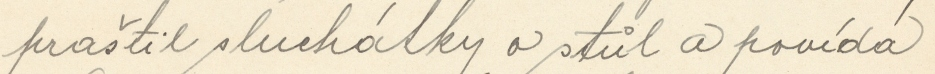praštil sluchátky o stůl a povídá:
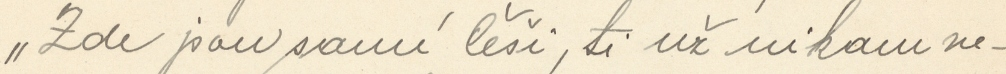„Zde jsou samí Češi, ti už nikam ne-
